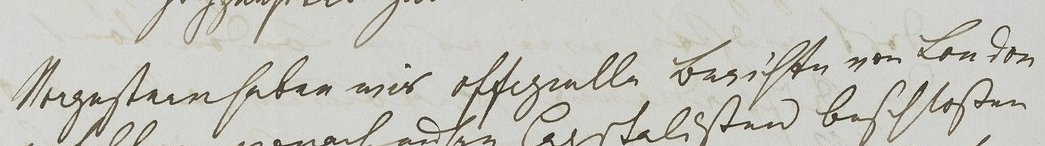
Vorgestern haben wir offizielle Berichte von London
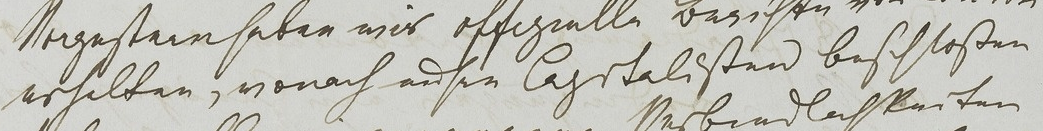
erhalten, wonach unsre Capitalisten beschloßen
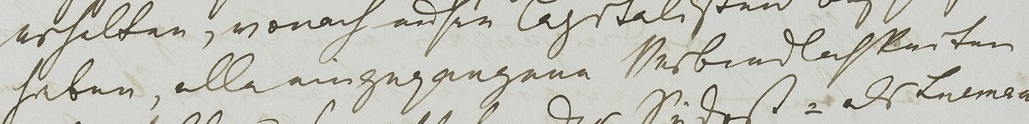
haben, alle eingegangene Verbindlichkeiten
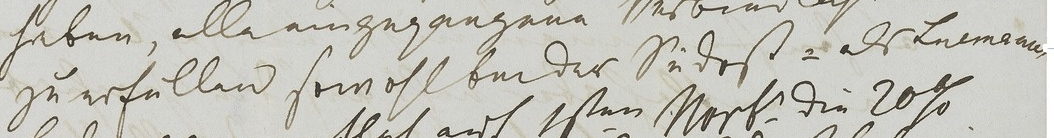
zu erfüllen sowohl bei der Südost- als Lucmanier
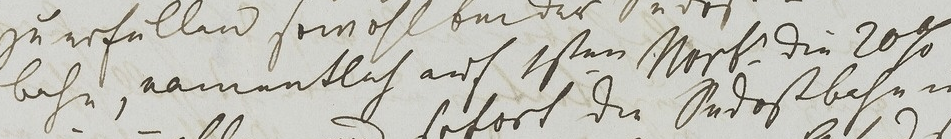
bahn, namentlich auf 1sten Novbr die 20%
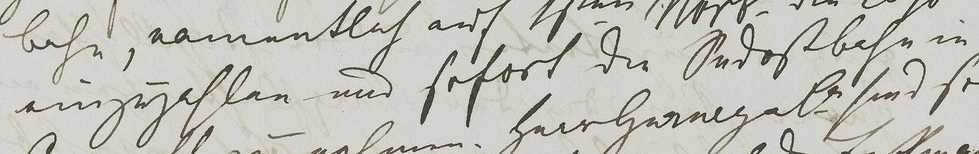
einzuzahlen und sofort die Südostbahn in
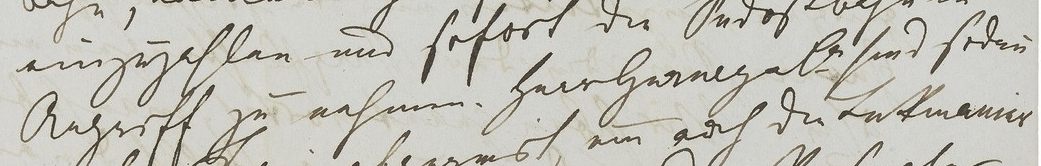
Angriff zu nehmen. Herr Gurney & Cie sind sodann
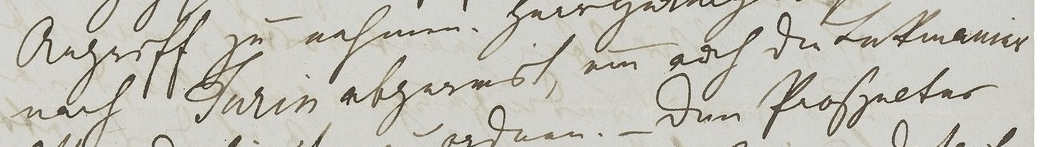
nach Turin abgereist, um auch die Lukmanier
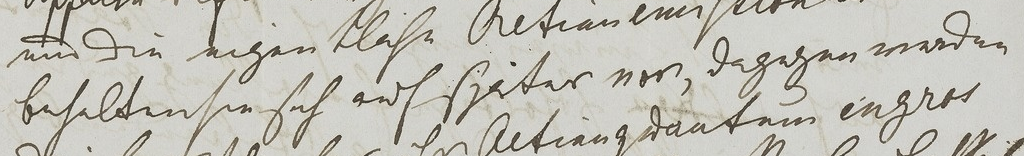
behalten sie sich auf später vor, dagegen werden
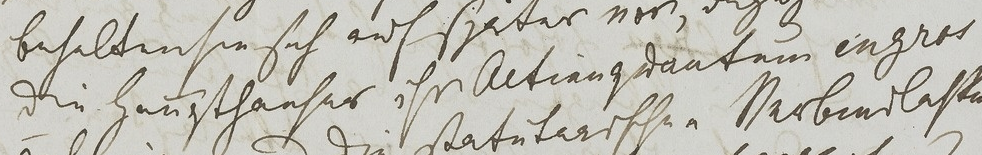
die Haupthäuser ihr Actienquantum en gros
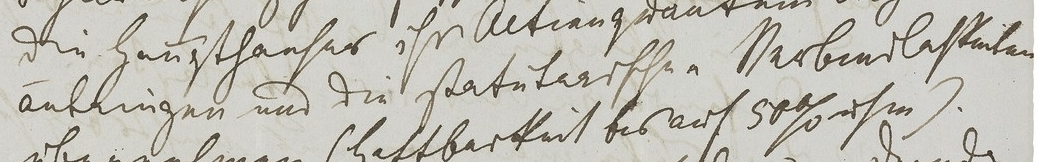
anbringen und die statutarischen Verbindlichkeiten
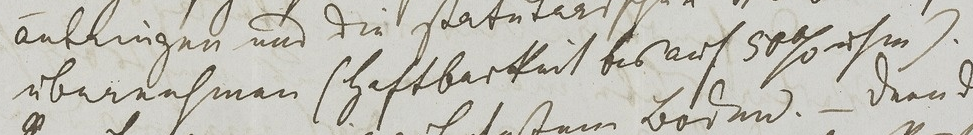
übernehmen (Haftbarkeit bis auf 50% usw.).
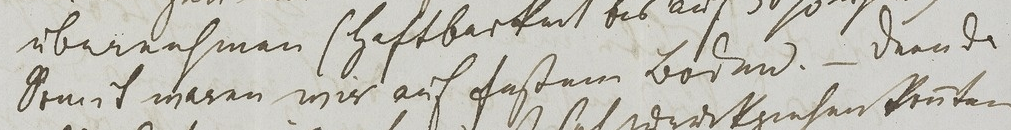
Somit waren wir auf festem Boden. – Denn da
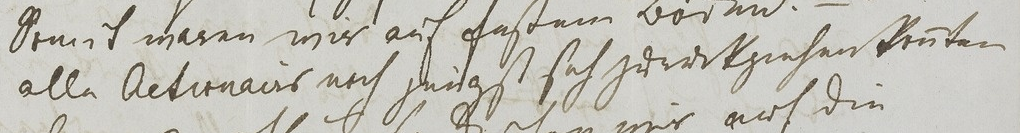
alle Actionairs noch jüngst sich zurückziehen konnten
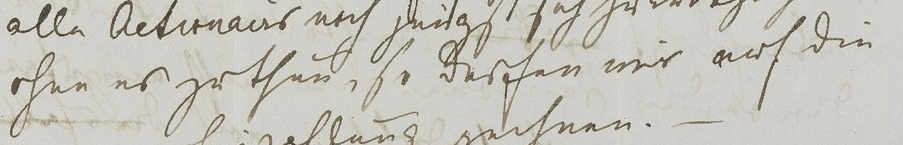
ohne es zu thun, so dürfen wir auf die
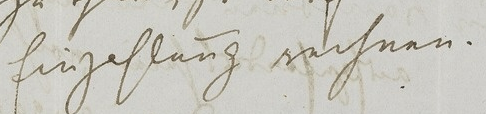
Einzahlung rechnen.
